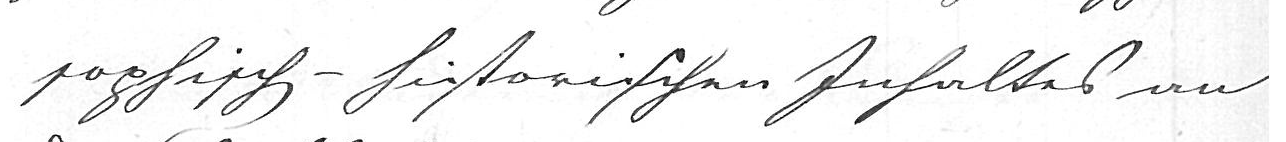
sophisch-historischen Inhaltes an
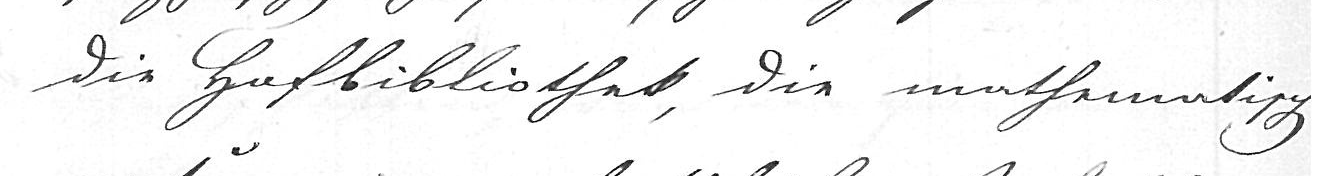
die Hofbibliothek, die mathematisch-
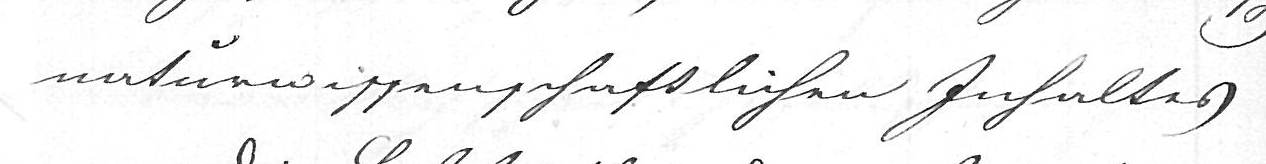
naturwissenschaftlichen Inhaltes
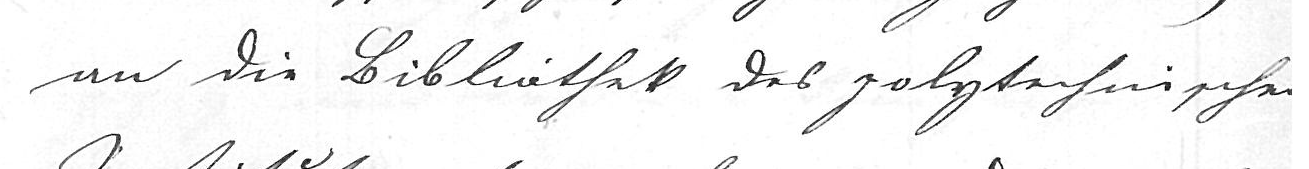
an die Bibliothek des polytechnischen
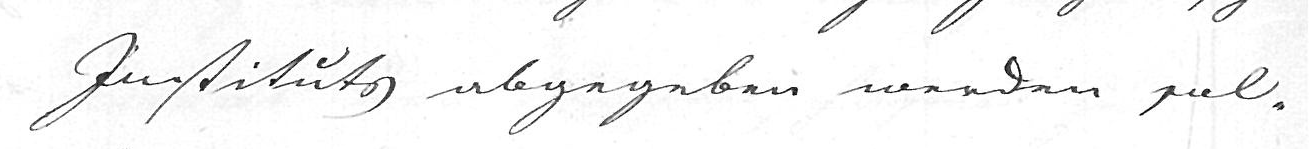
Instituts abgegeben werden sol-
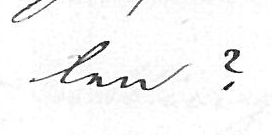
len?
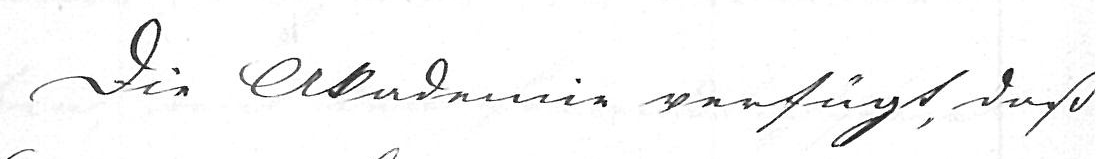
Die Akademie verfügt, daß
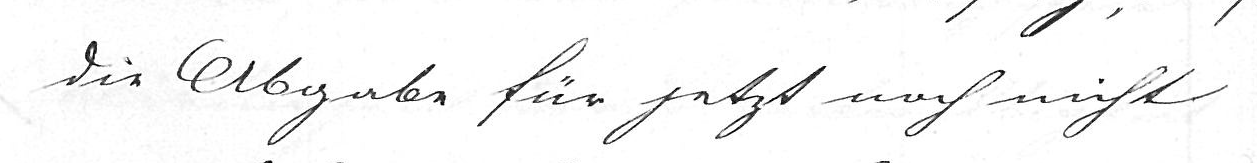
die Abgabe für jetzt noch nicht
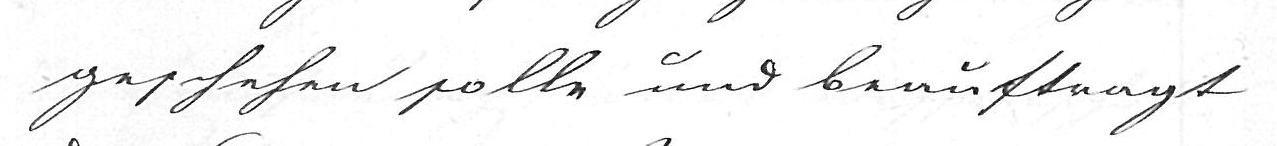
geschehen solle und beauftragt
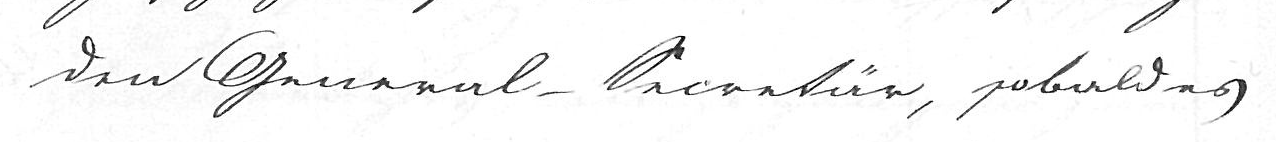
den General-Secretär, sobald es
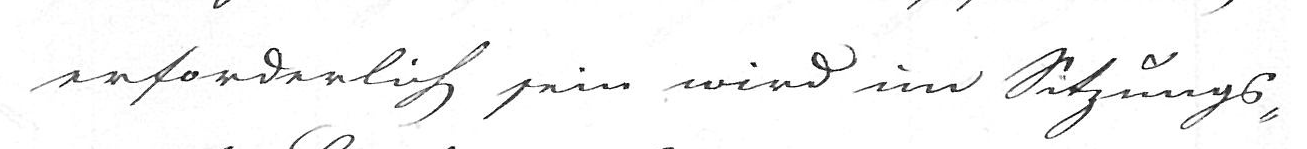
erforderlich sein wird im Sitzungs-
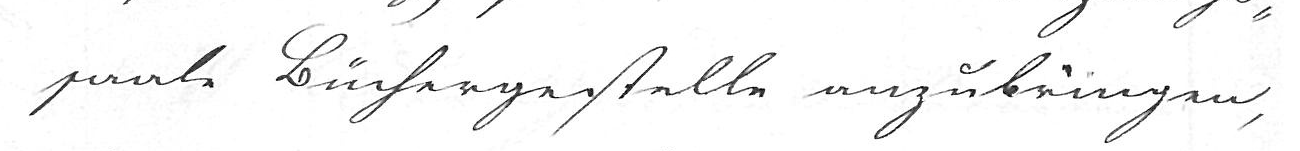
saale Büchergestelle anzubringen,
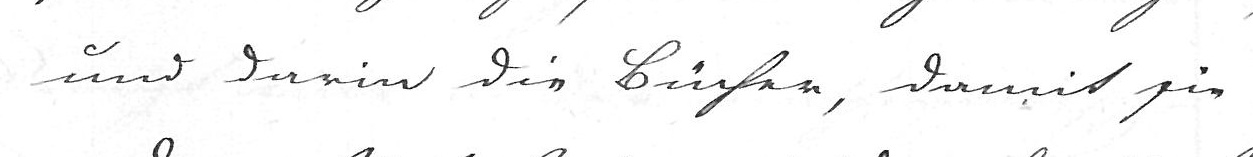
und darin die Bücher, damit sie
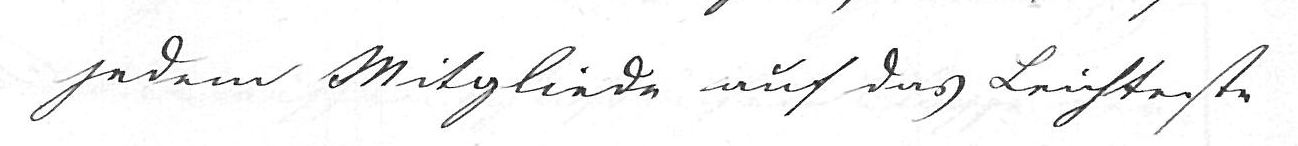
jedem Mitgliede auf das Leichteste
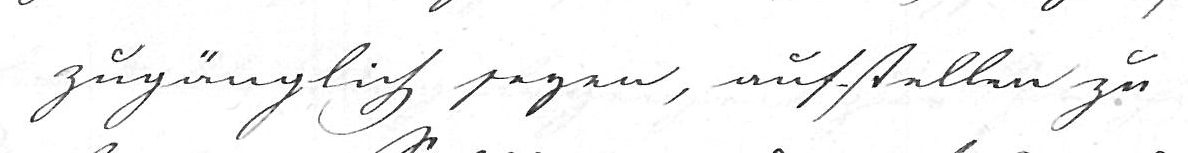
zugänglich seyen, aufstellen zu
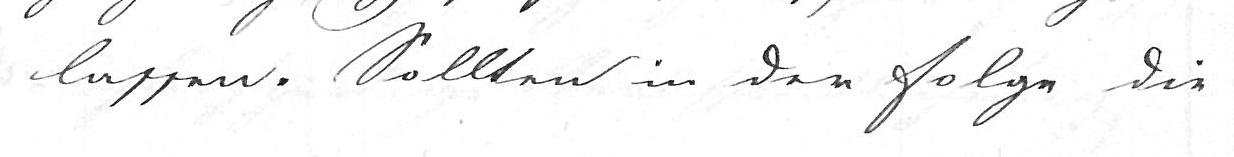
lassen. Sollten in der Folge die
